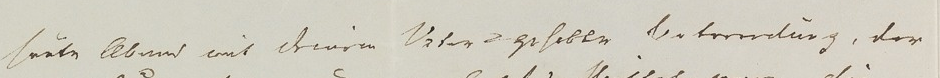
heute Abend mit deinem Vater gehabte Unterredung, der
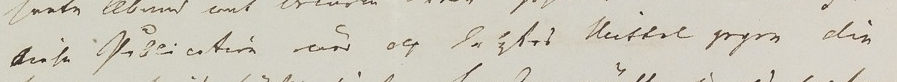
diese Publication nur als letztes Mittel gegen die
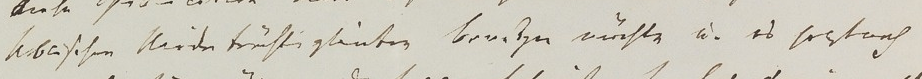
Kublischen Niederträchtigkeiten benutzen möchte u. es jetzt noch
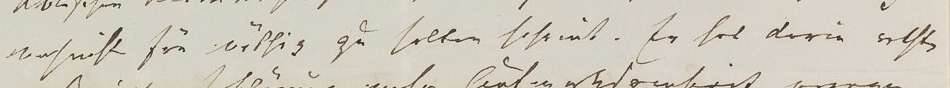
noch nicht für nöthig zu halten scheint. Er hat darin recht,
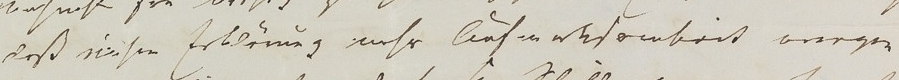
daß diese Erklärung mehr Aufmerksamkeit erregen
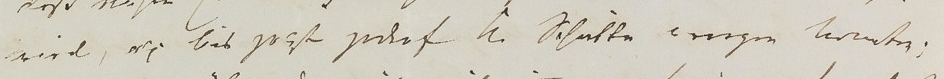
wird, als bis jetzt jedenf K. Schritte erregen konnten;
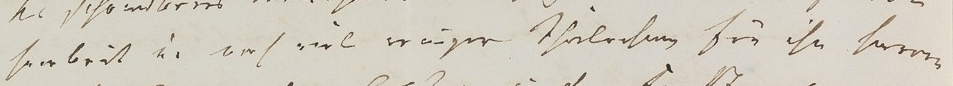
samkeit u. noch viel weniger Theilnahme für ihn hervor-
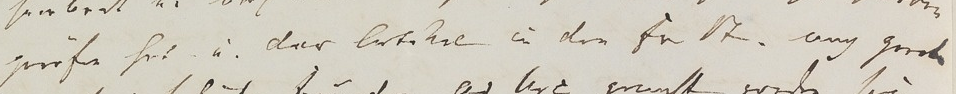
gerufen hat u. der Artikel in den Fr. St. nach gerade
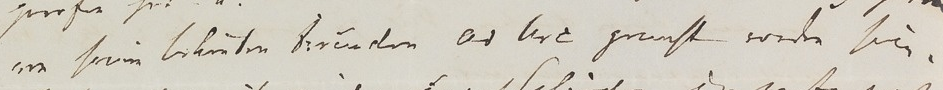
von seinen bekannten Freunden ad hoc gemacht worden seie.
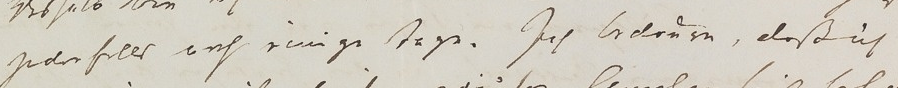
jedenfalls noch einige Tage. Ich bedaure, daß ich
